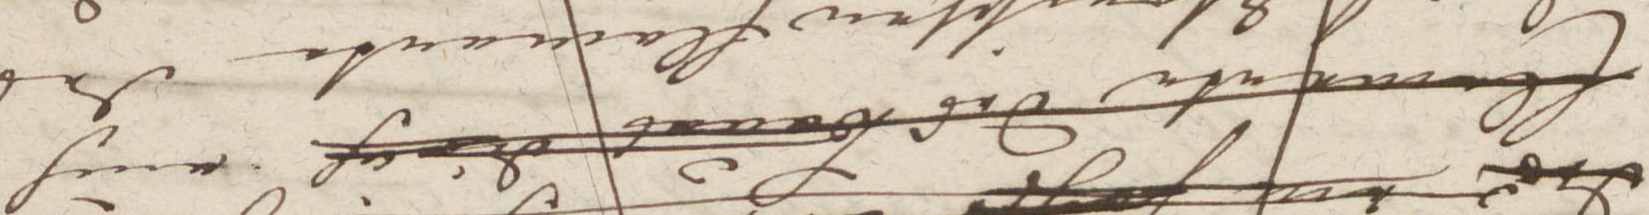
seiner Stelle gezeigt werden. noch Einiges folgen wird. %
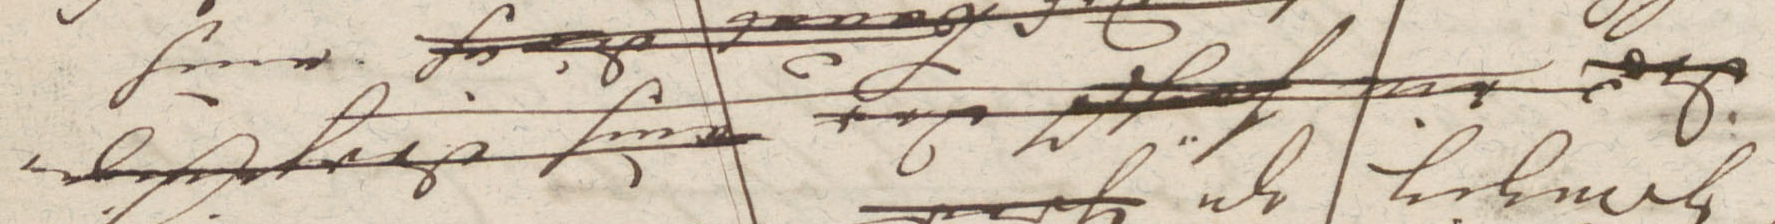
Diess führt uns zu einer anderen
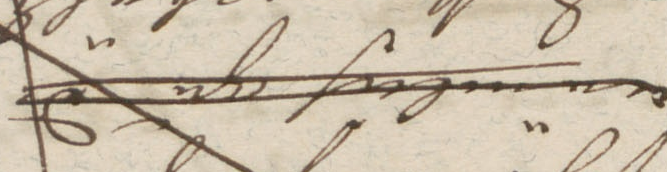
geradezu Nachahmung
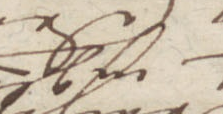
zeigen.
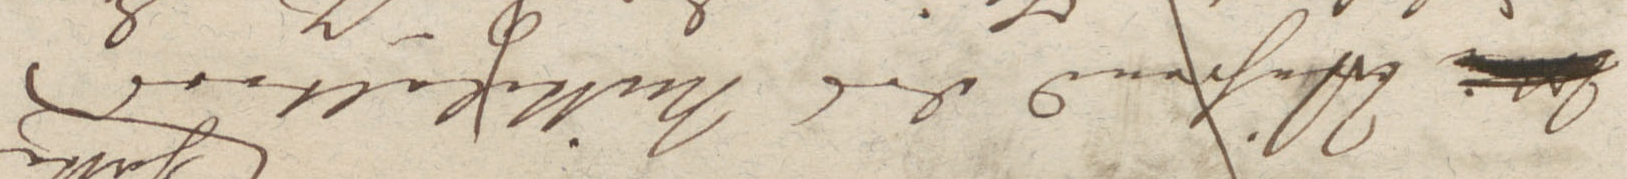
anderen sehr wichtigen Frage,
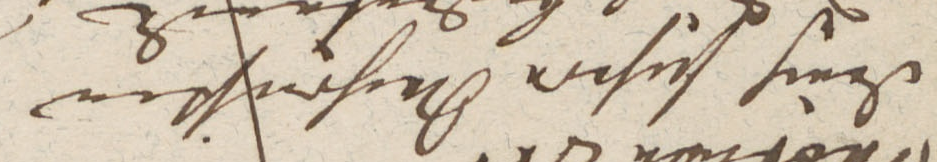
dere Eingehen auf dieselbe
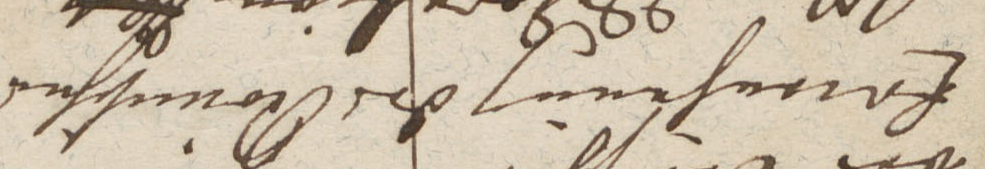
das ein höchst der auch derjenigen
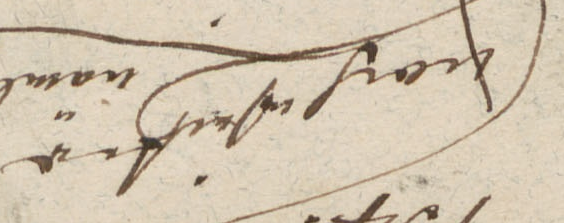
Es ist ausgemacht,
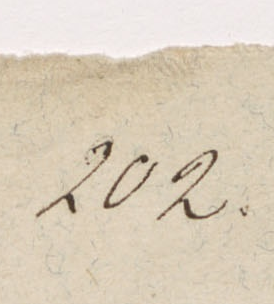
202.
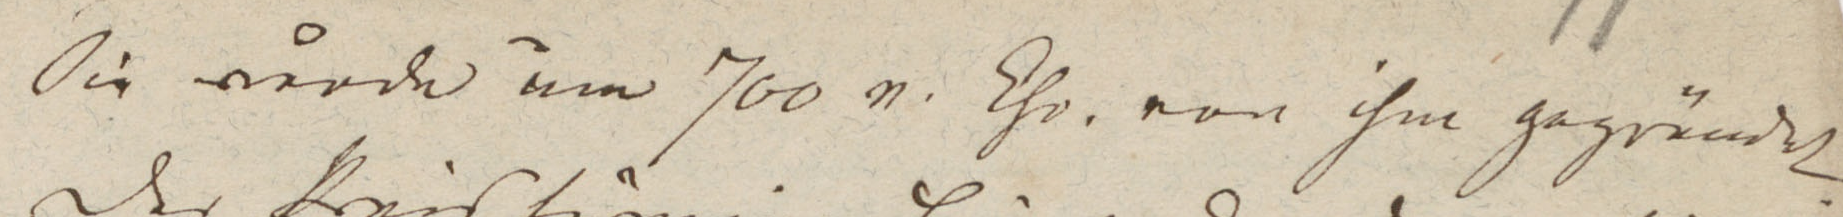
Sie wurde um 700 v. Chr. von ihm gegründet.
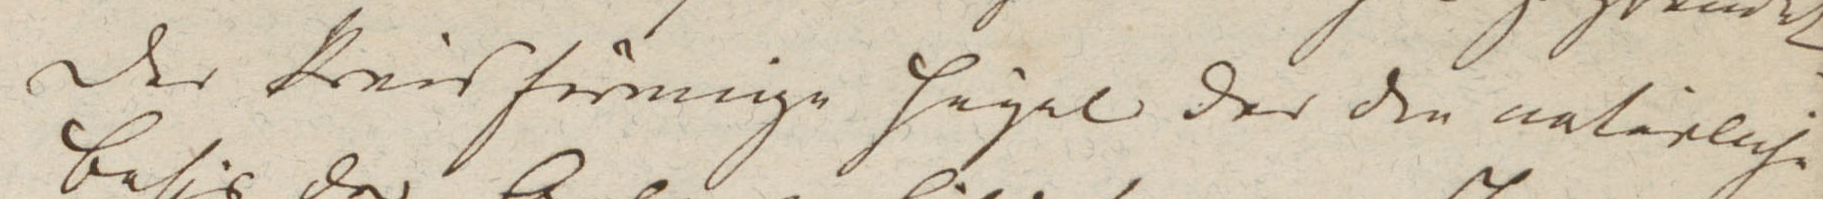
Der kreisförmige Hügel der die natürliche
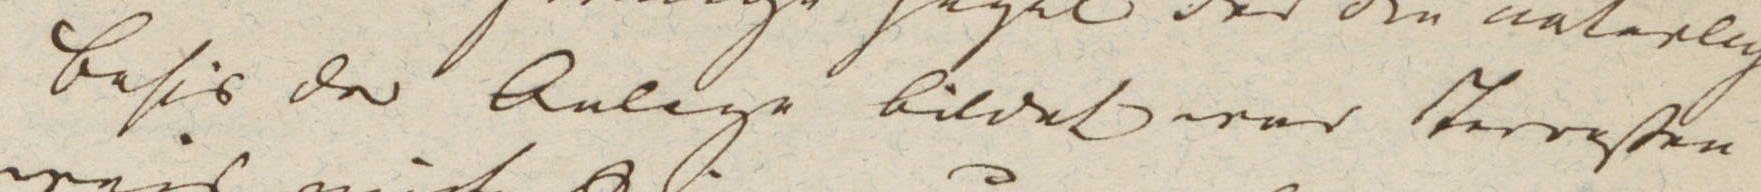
Basis der Anlage bildet war Terrassen-
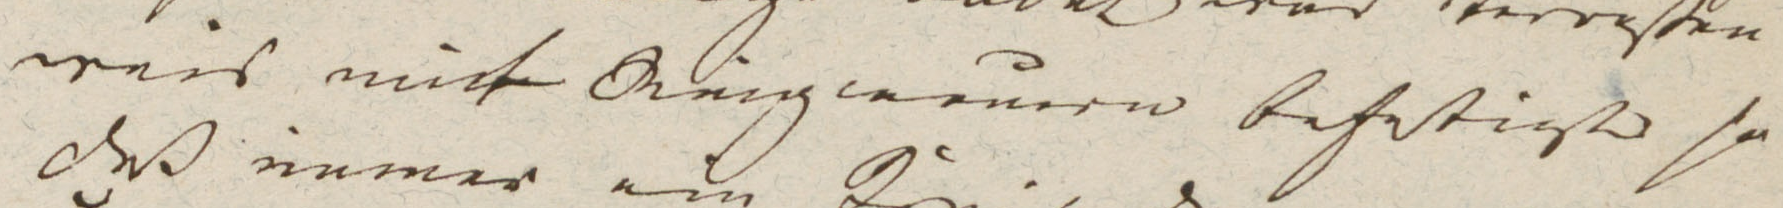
weis mit Ringmauern befestigt so
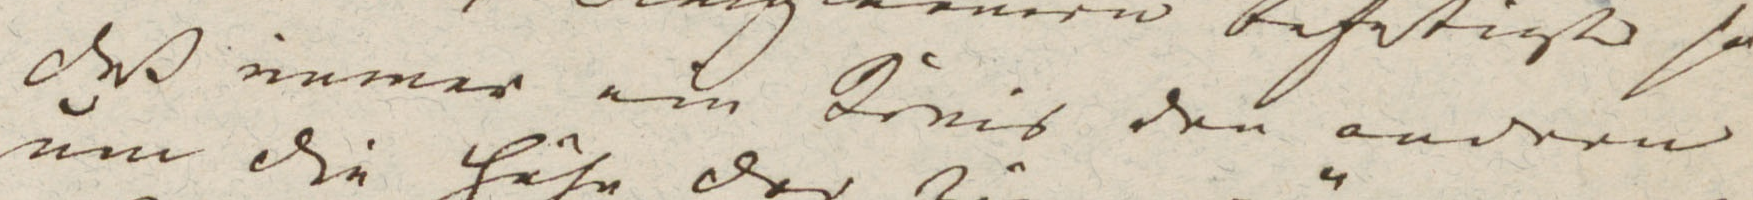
dass immer ein Kreis den andern
